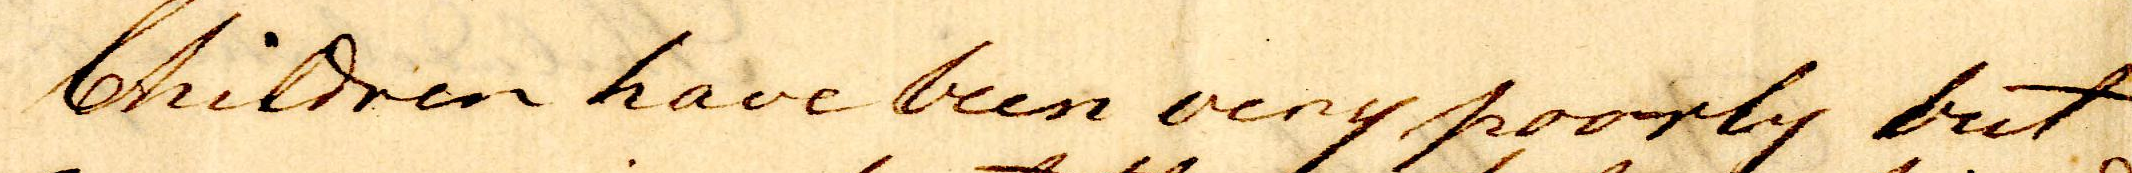Children have been very poorly but
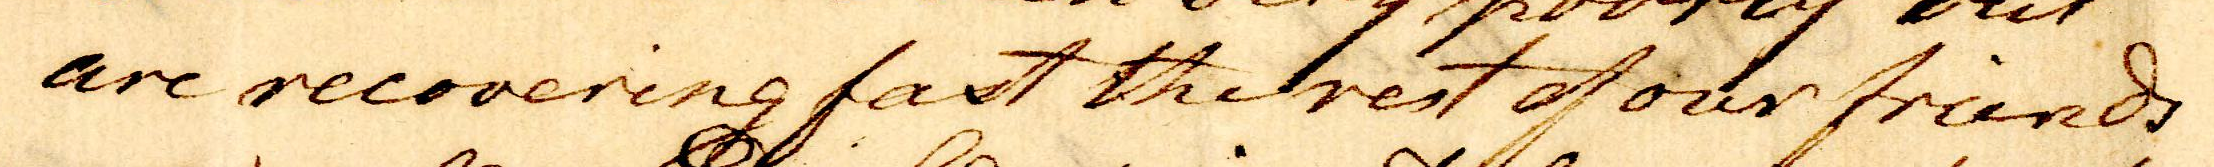are recovering fast the rest of our friends
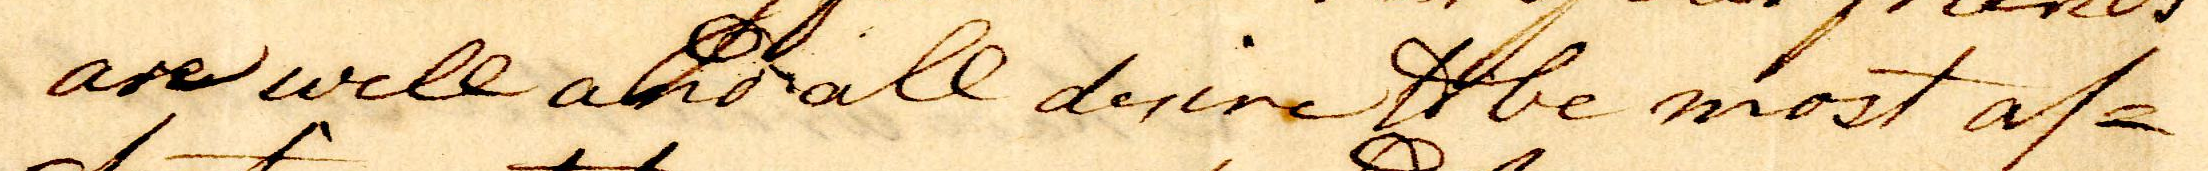are well and all desire to be most af-
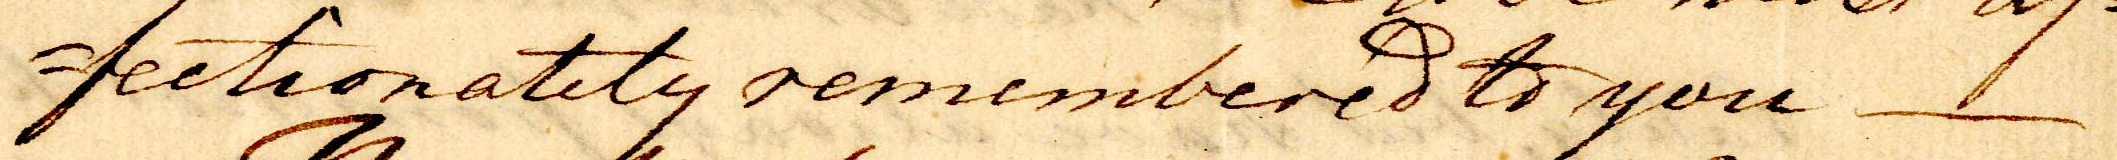-fectionately remembered to you-
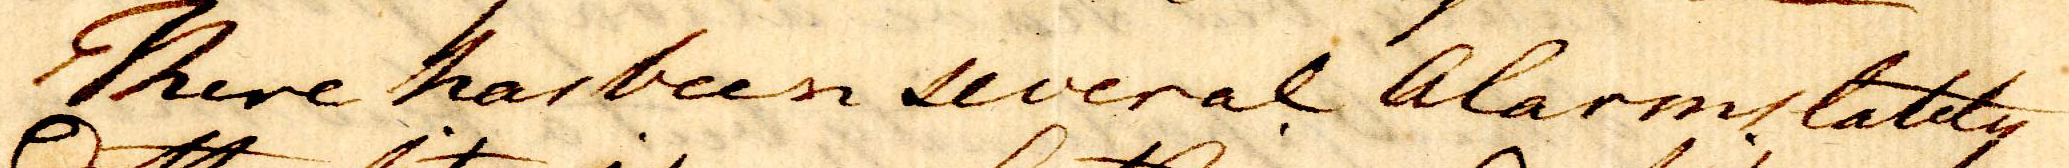There has been several Alarms lately
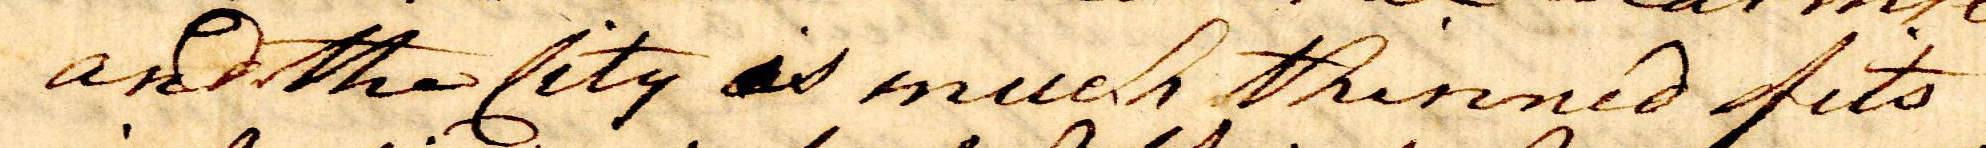and the City is much thinned of its
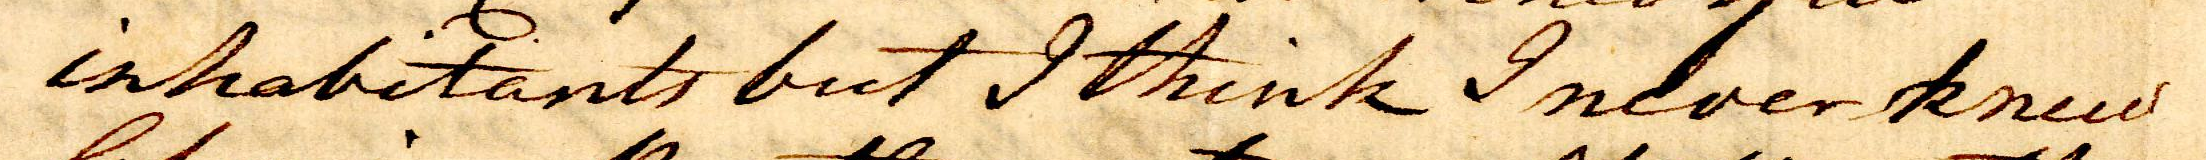inhabitants but I think I never knew
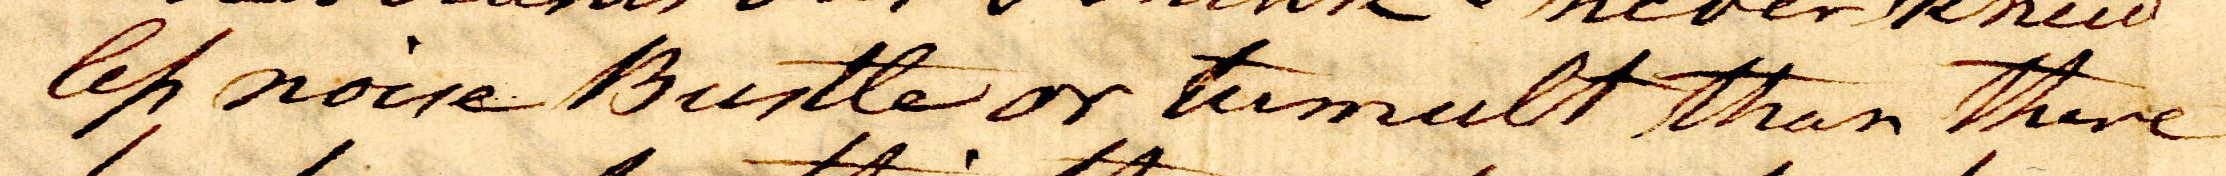less noise Bustle or tumult than there
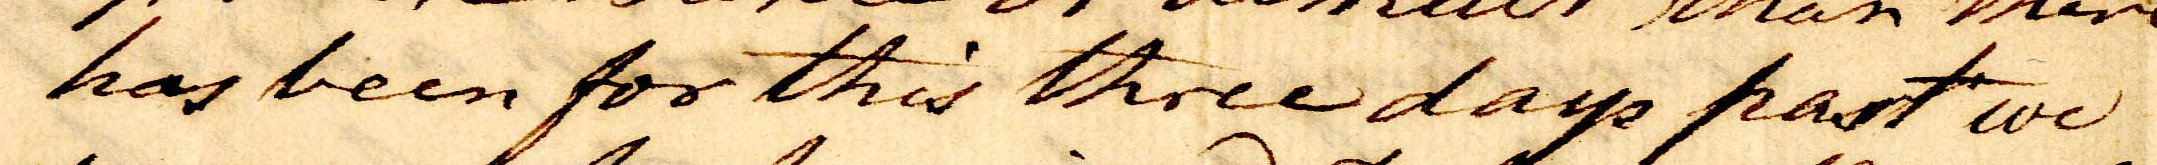has been for this three days past we
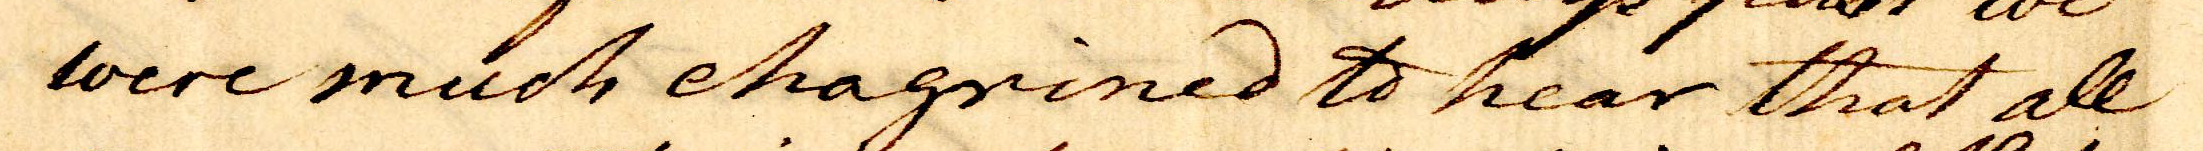were much chagrined to hear that all
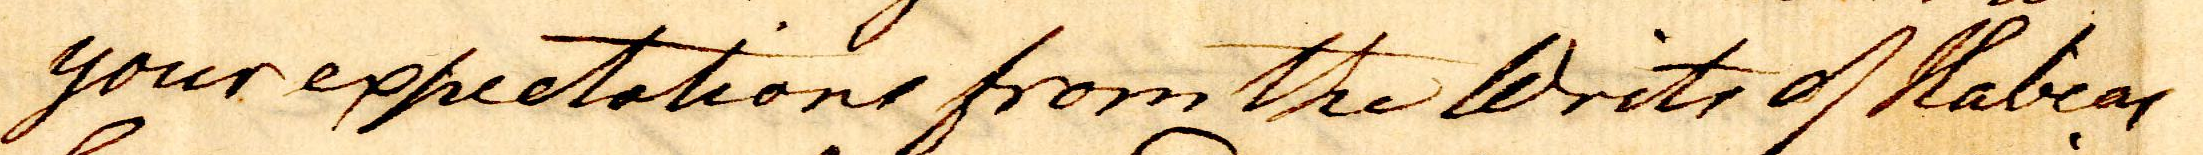your expectations from the Writs of Habeas
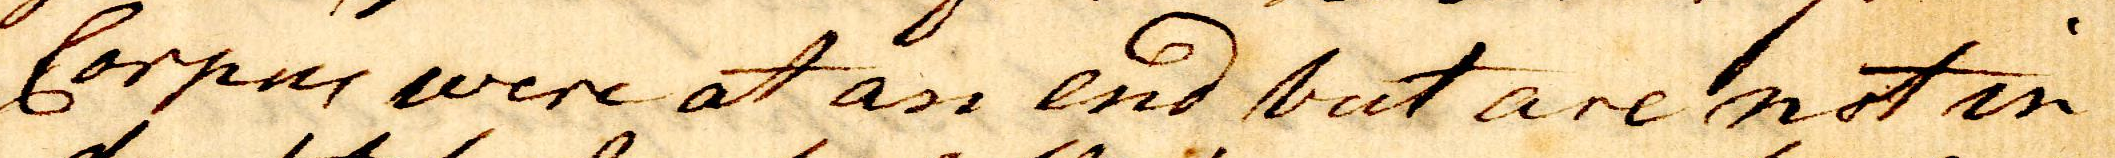Corpus were at an end but are not in
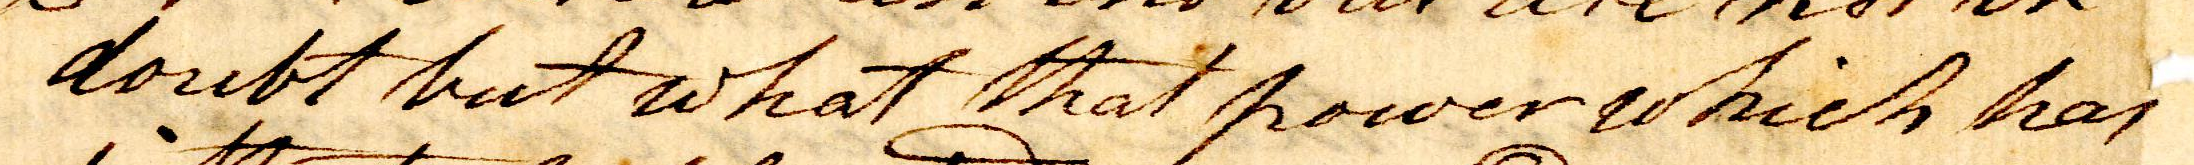doubt but what that power which has
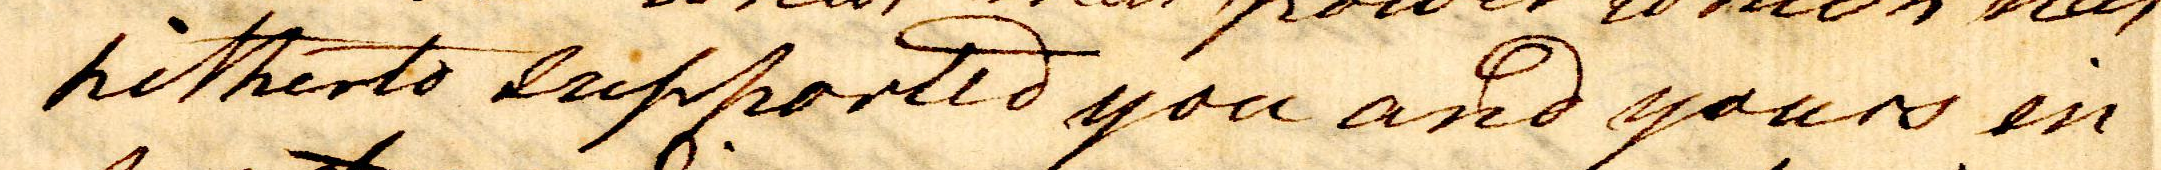hitherto supported you and yours in
